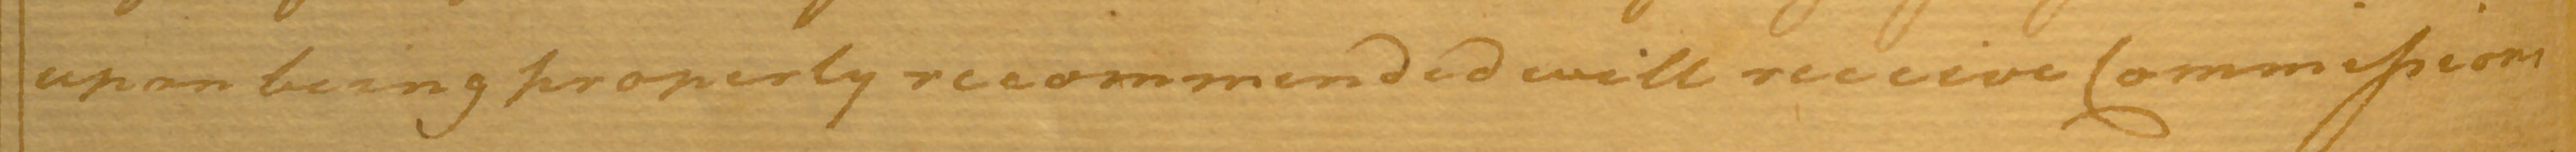upon being properly recommended will receive Commissions
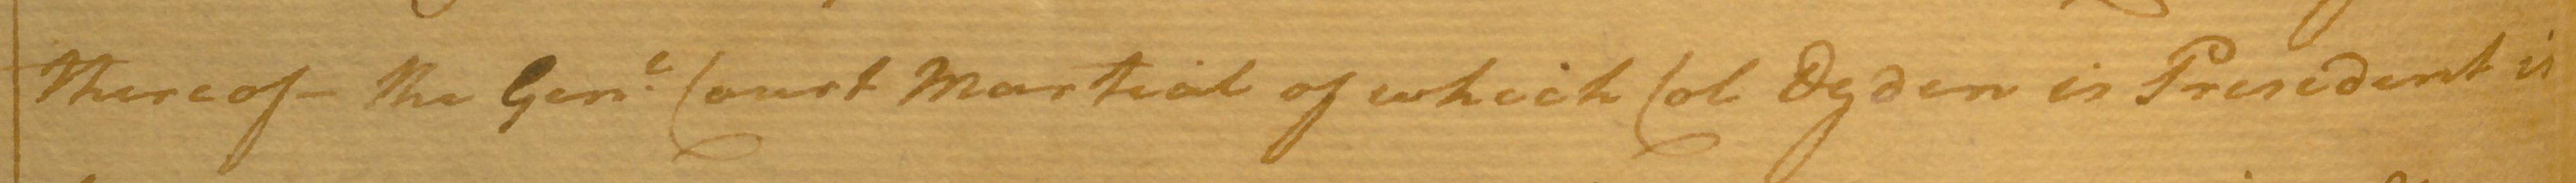thereof-the Gen^l. Court Martial of which Col Ogden is President is
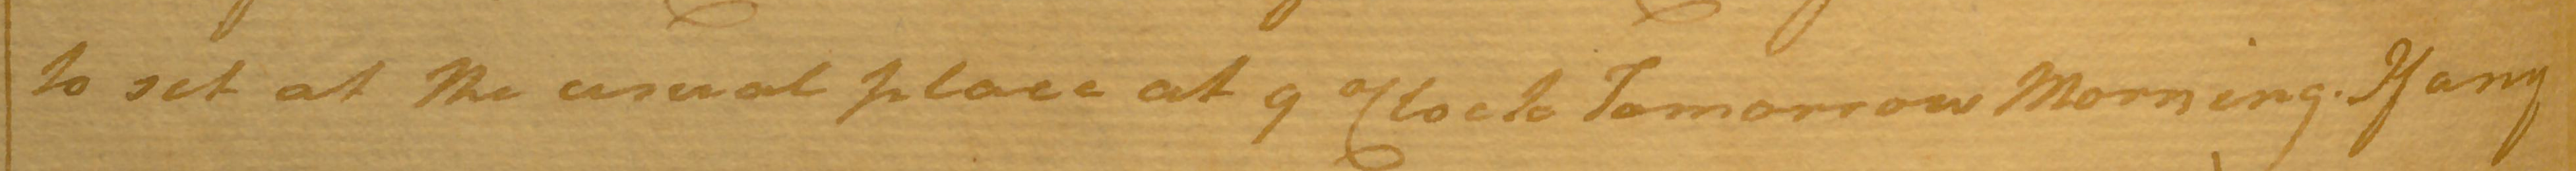to set at the usual place at 9 ^oClock Tomorrow Morning. If any
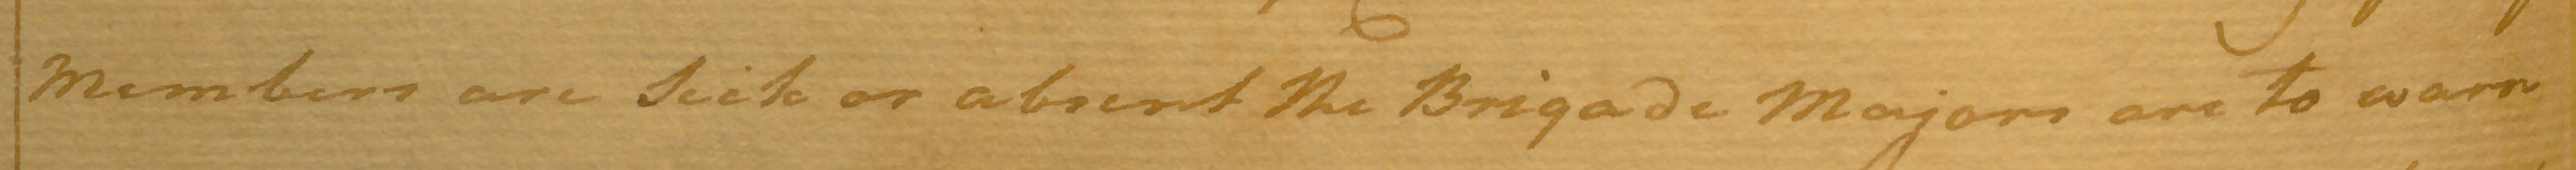Members are sick or absent the Brigade Majors are to warn
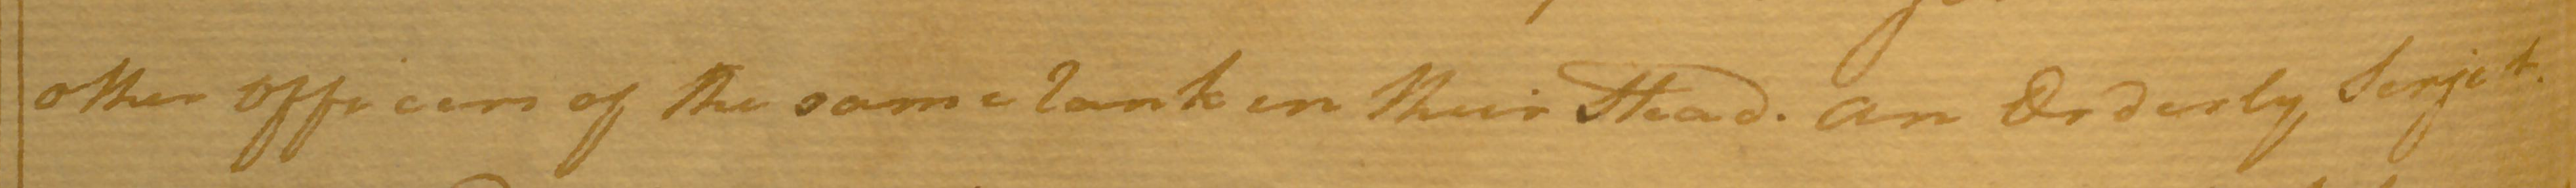other Officers of the same rank in their Stead. An Orderly Serj^t.
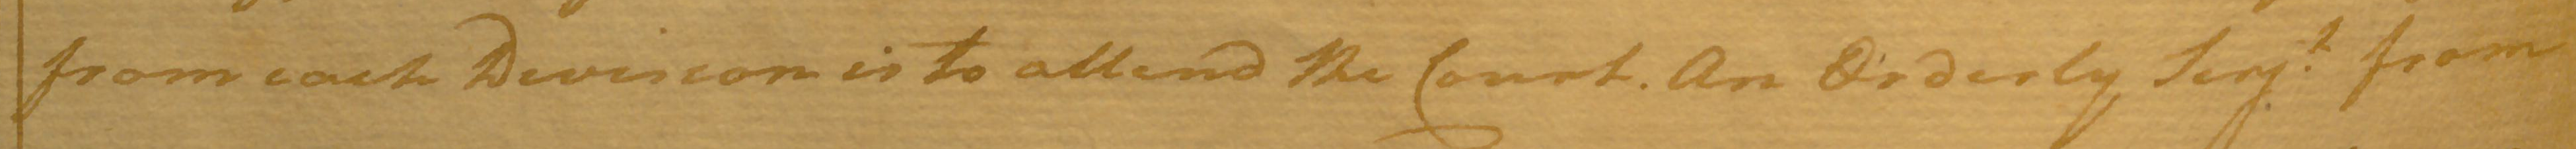from each Division is to attend the Court. An Orderly Serj^t. from
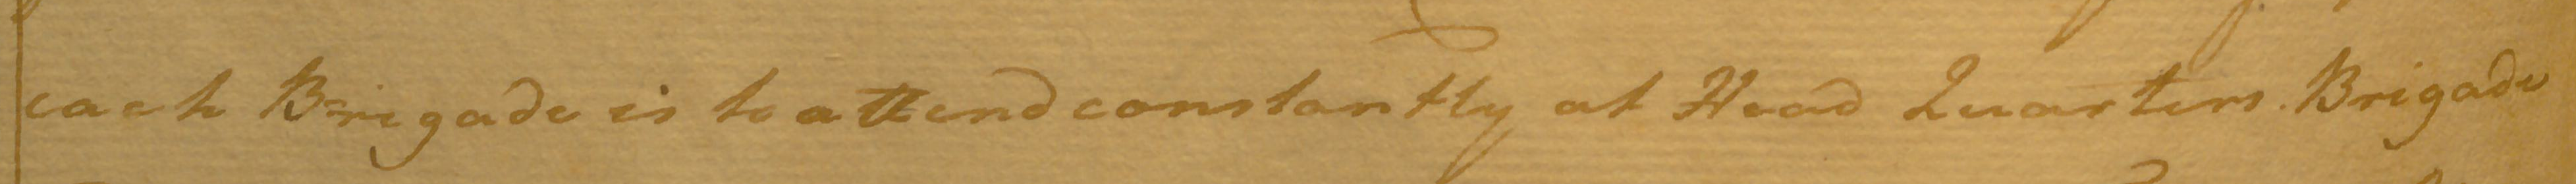each Brigade is to attend constantly at Head Quarters. Brigade
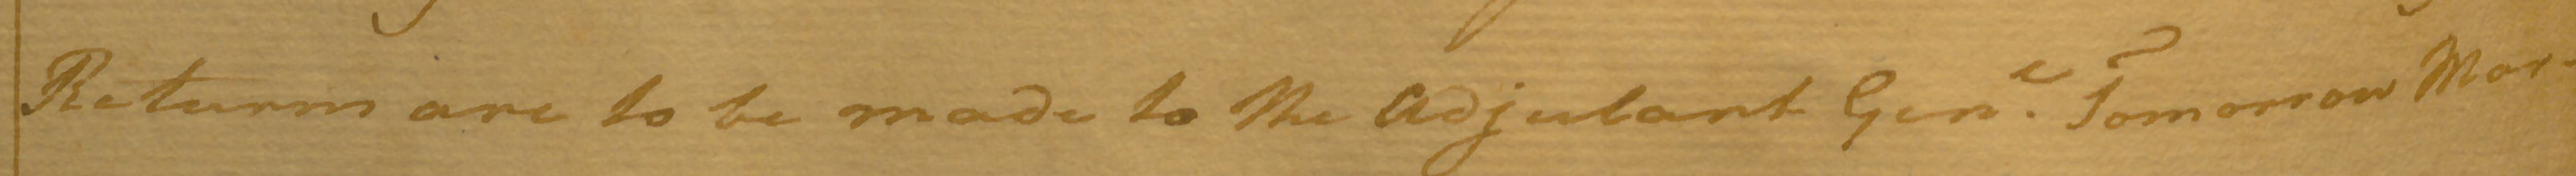Returns are to be made to the Adjutant Gen^l. Tomorrow Mor-
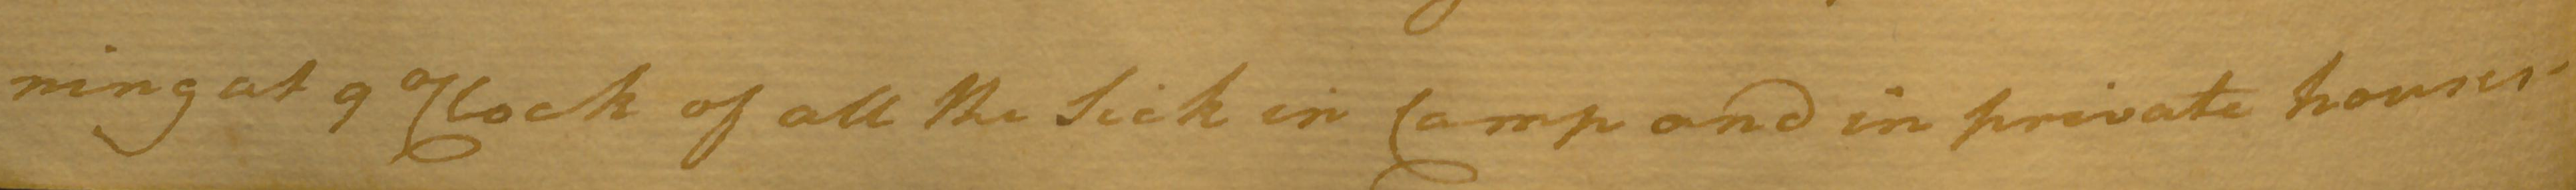ning at 9 ^oClock of all the Sick in Camp and in private houses-
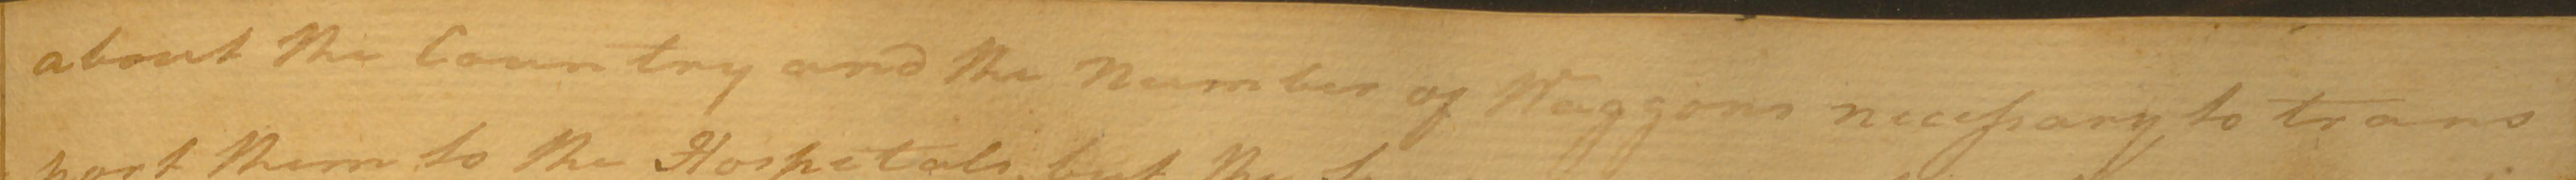about the Country and the Number of Waggons necessary trans
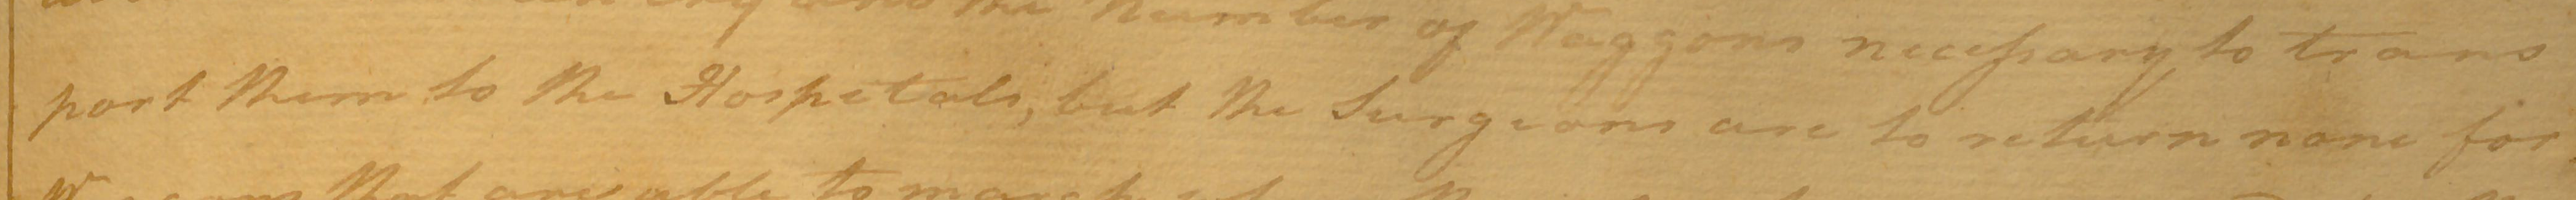port them to the Hospitals, but the Surgeons are to return none for
